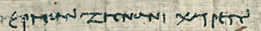ερμων ζηνωνι χαιρειν
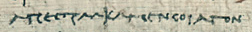απεϲταλκαμενϲοιαγον
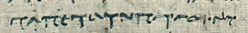ταπετωυνπαραδιονυ
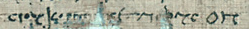ϲιουκορμ ϲελα ουϲ οη
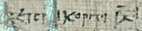ειϲινκορμοι ι̅α
